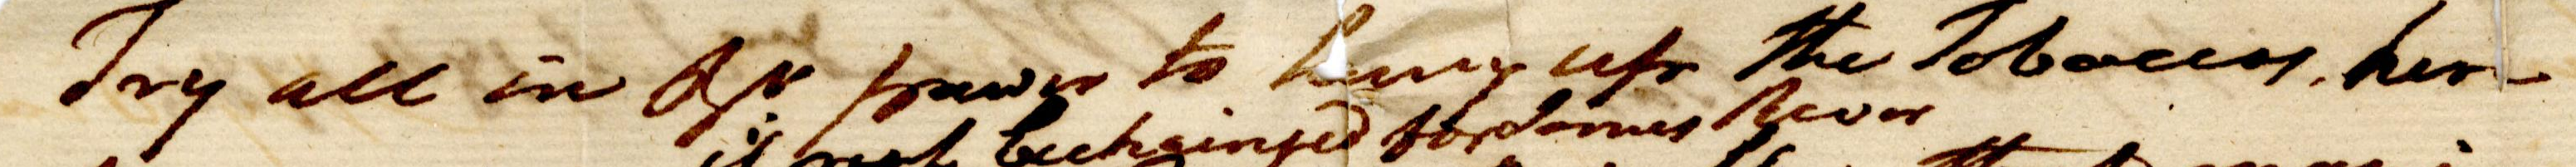Try all in &^r power to bring up the Tobacco here
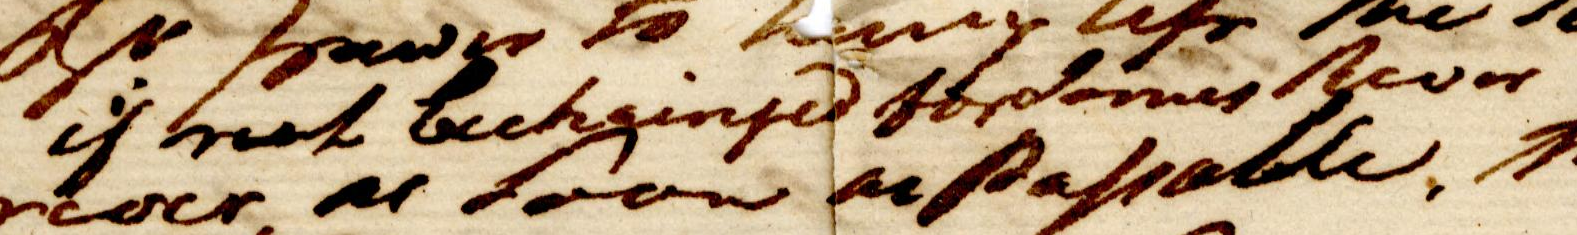if not be Exchainged to James River
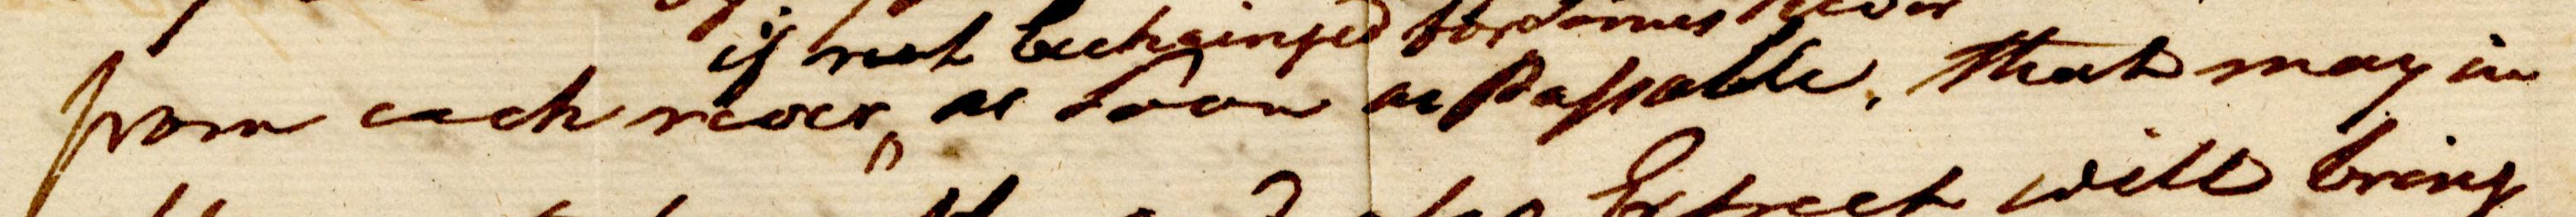from each river ^ as soon as possable, that may in
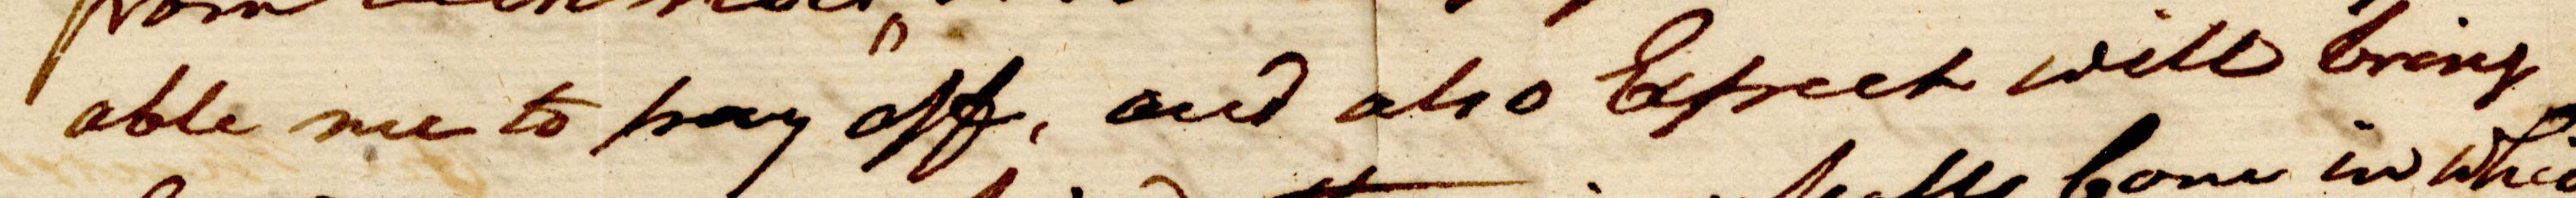able me to pay off, and also Expect will bring
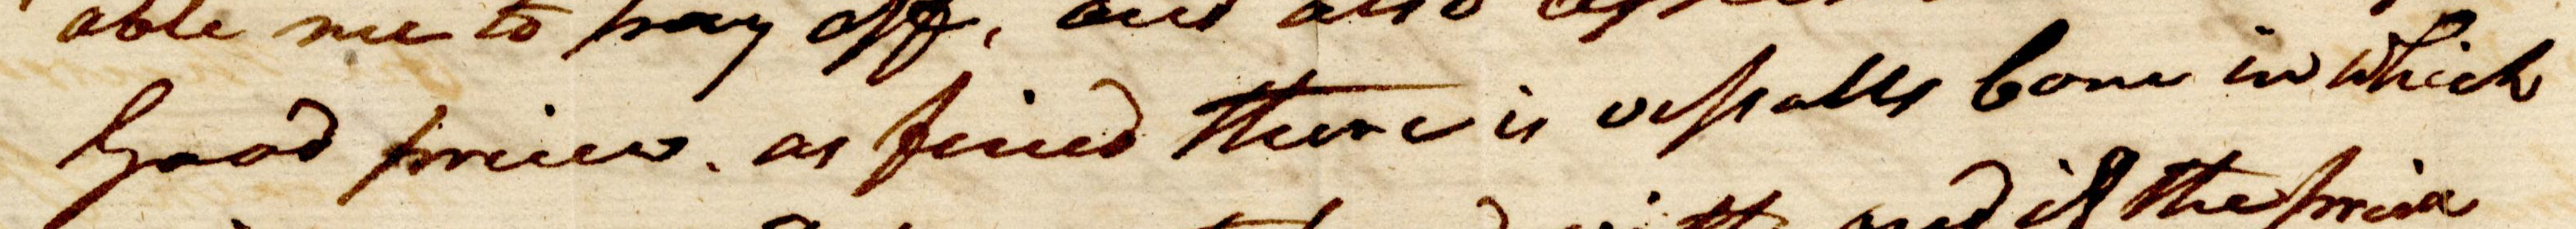Good prices. as priced there is vessalls Come in which
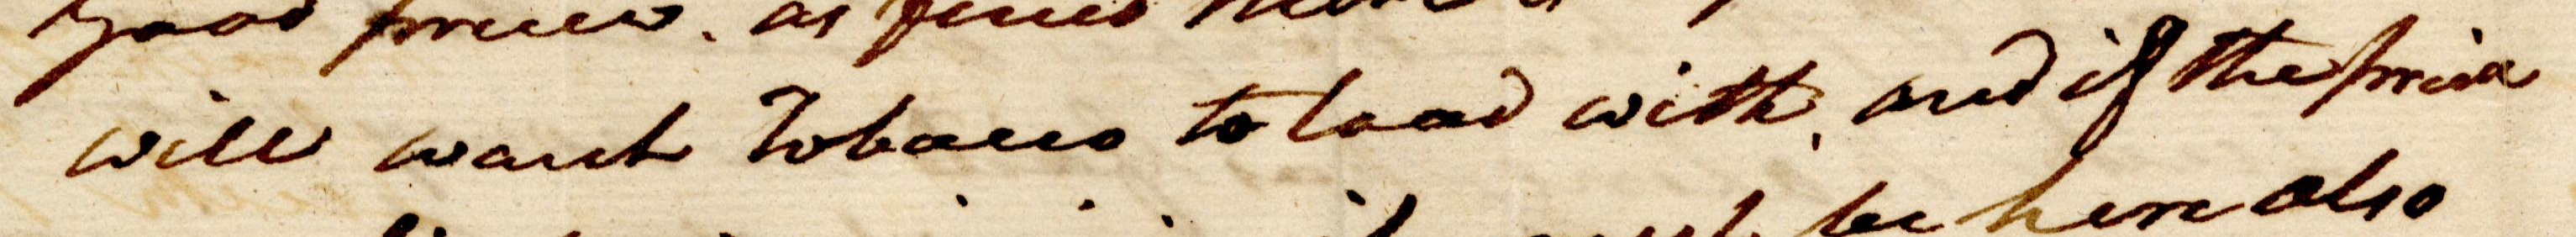will want Tobacco to load with, and if the prices
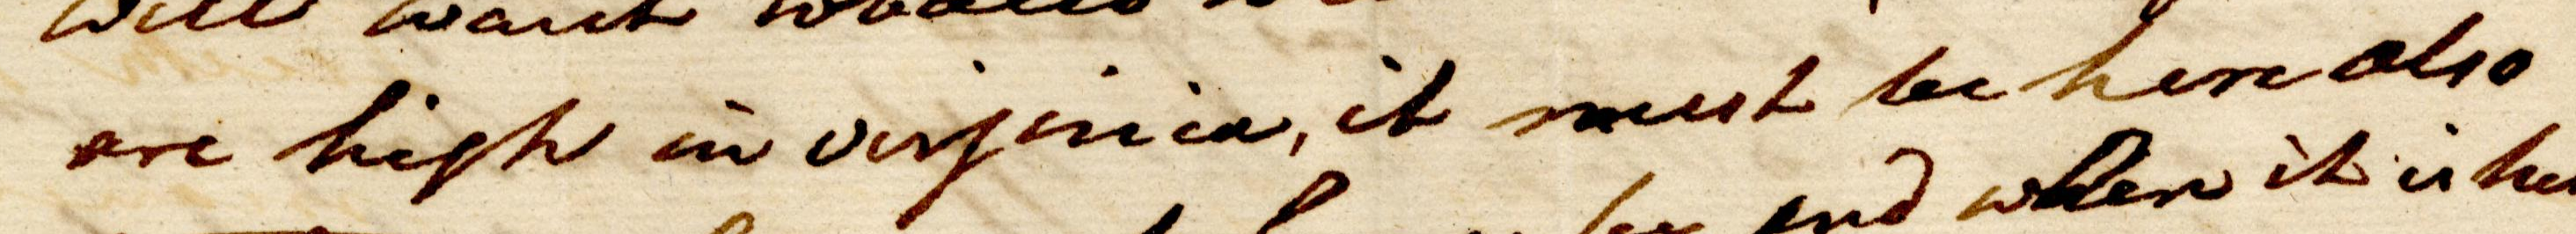are high in Virginia, it must be here also
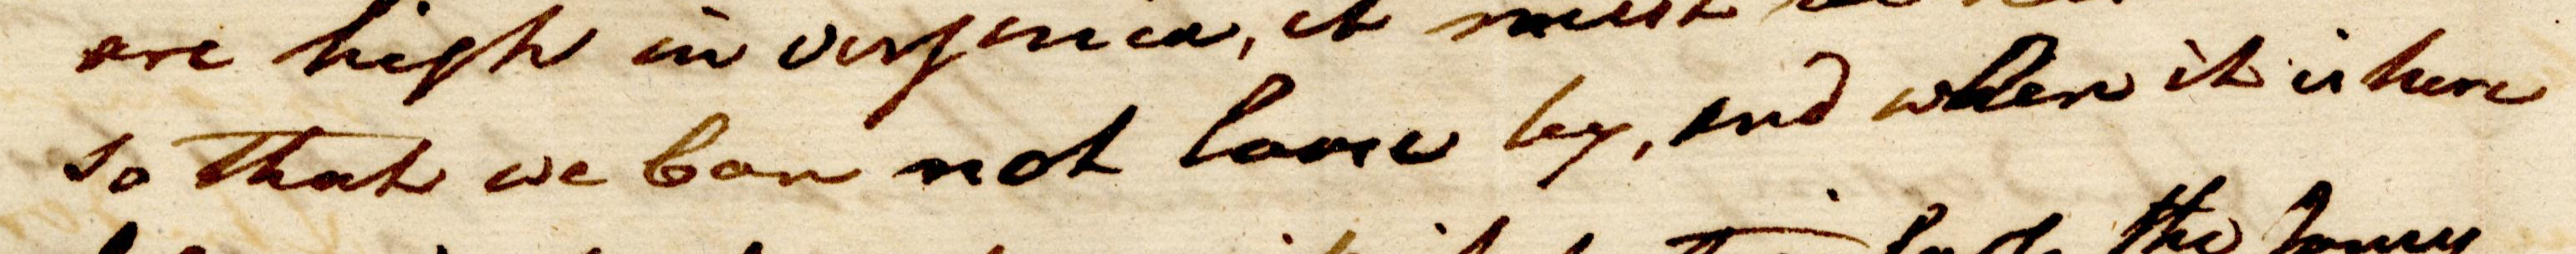so that we can not come by, and when it is here
